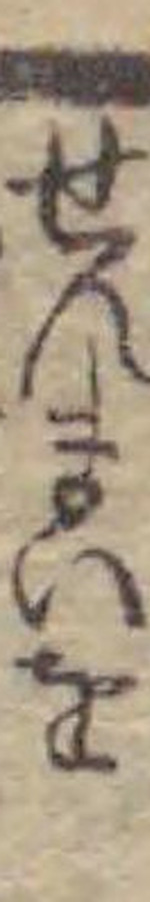せんまいを
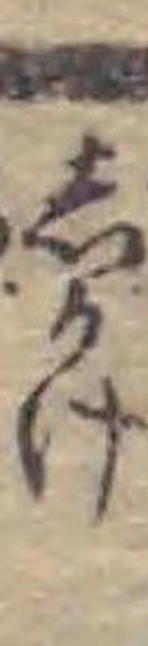しかけ
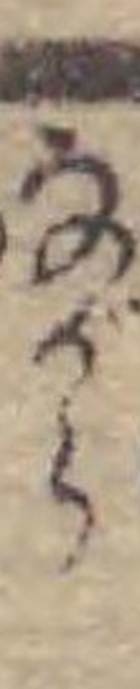ながら
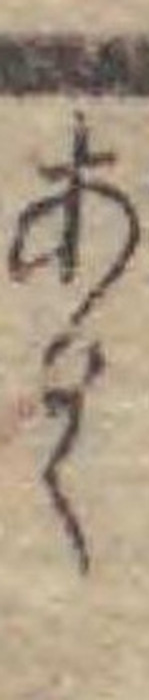あるく
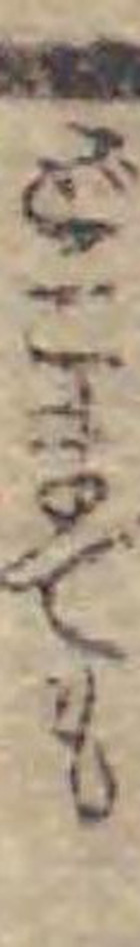どこまでも
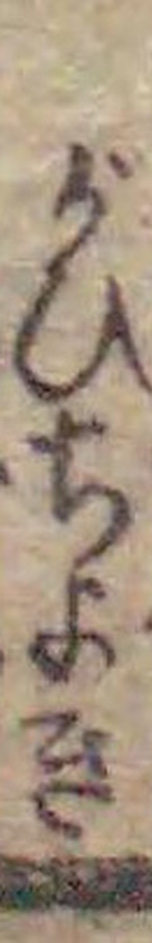がひちよき
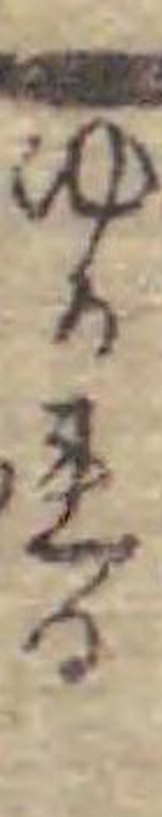ゆかれる
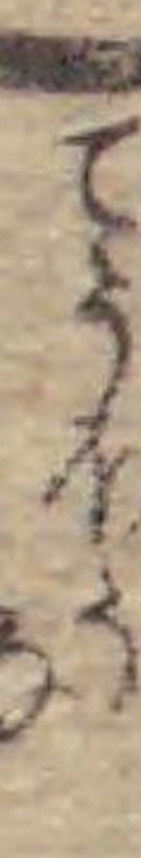てうほう
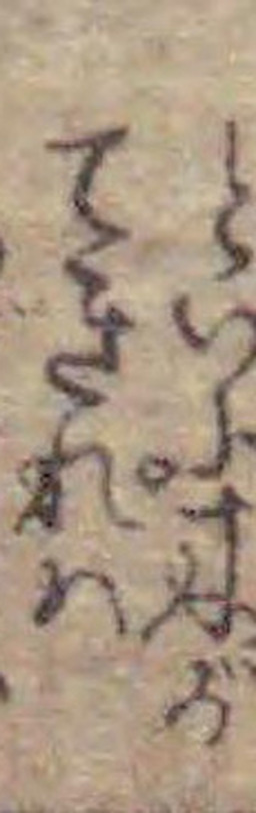てきれは
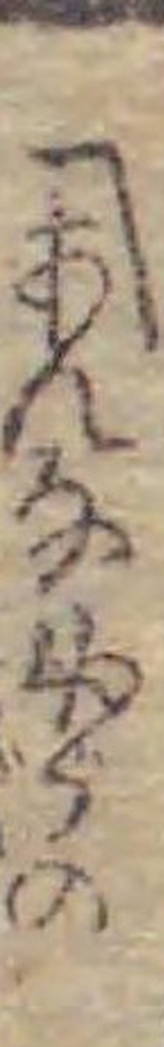〽あんな女郎の
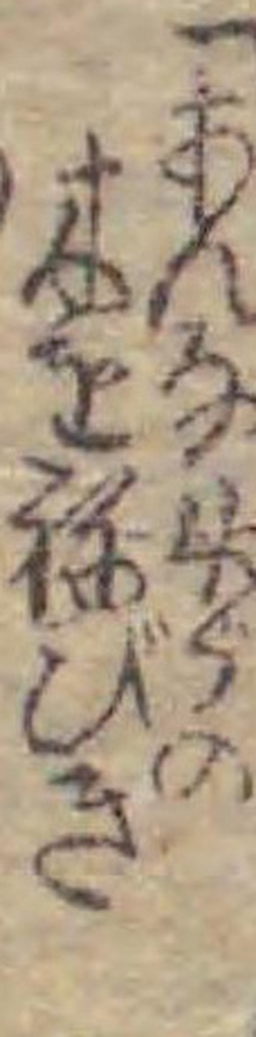木をねびき
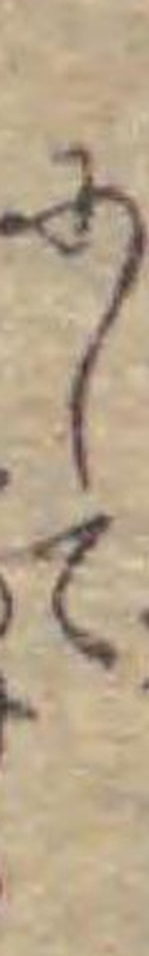にして
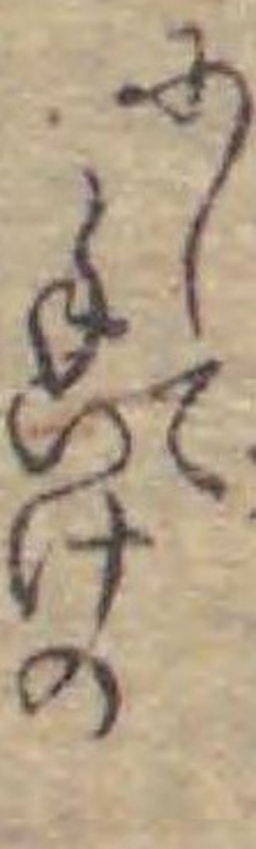手いけの
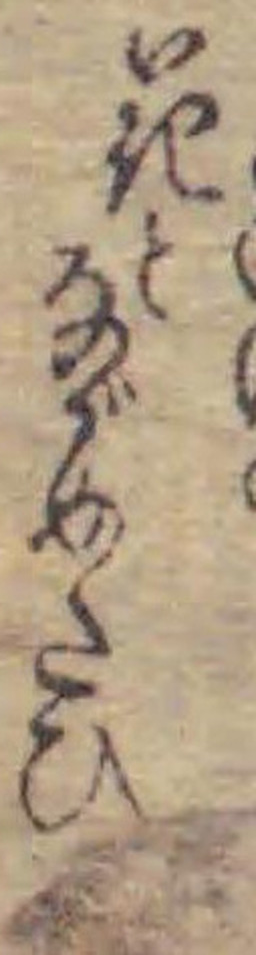ながめたひ

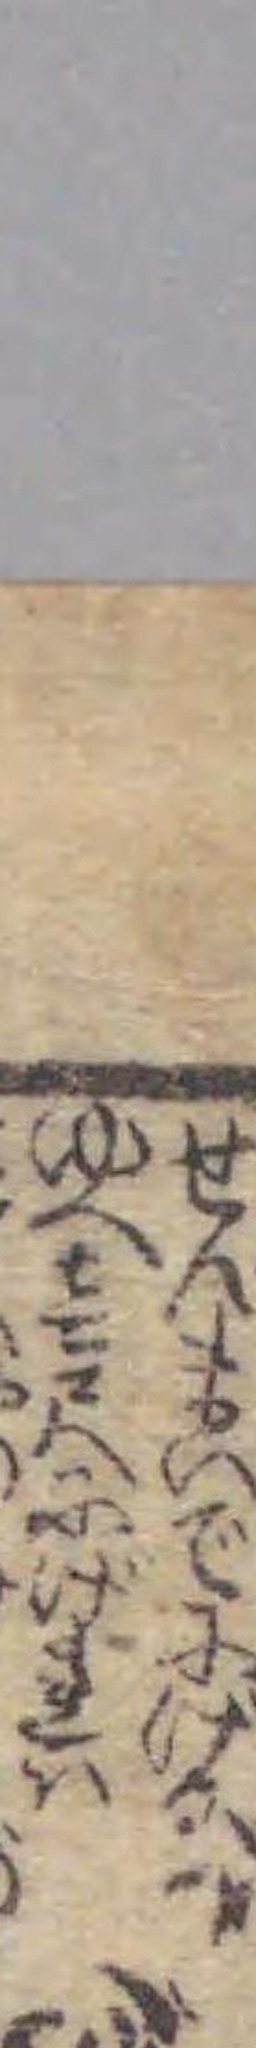ゆへ壱尺にげれは
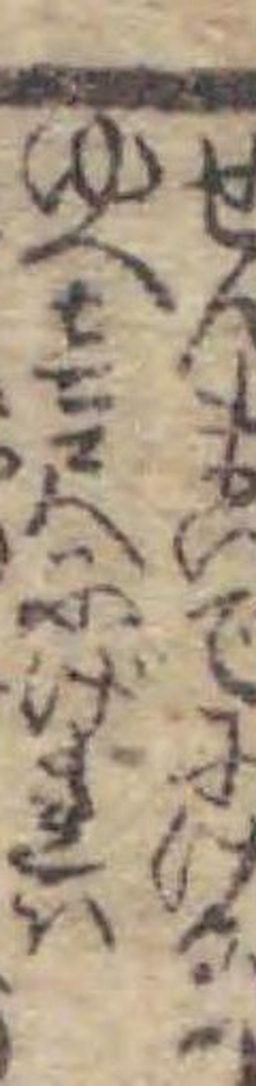ゆへ壱尺にげれは
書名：奇妙頂礼胎錫杖 : 3巻
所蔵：国立国会図書館 National Diet Library, JAPAN
